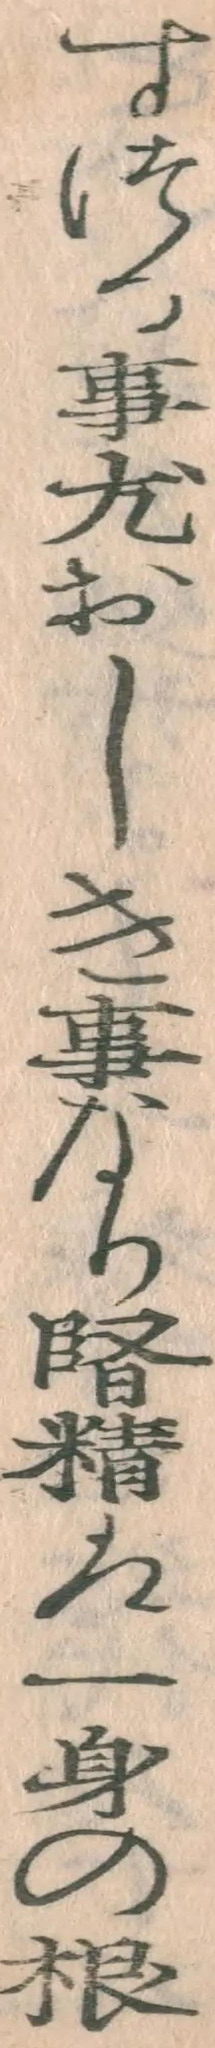すつる事尤おしき事なり腎精は一身の根
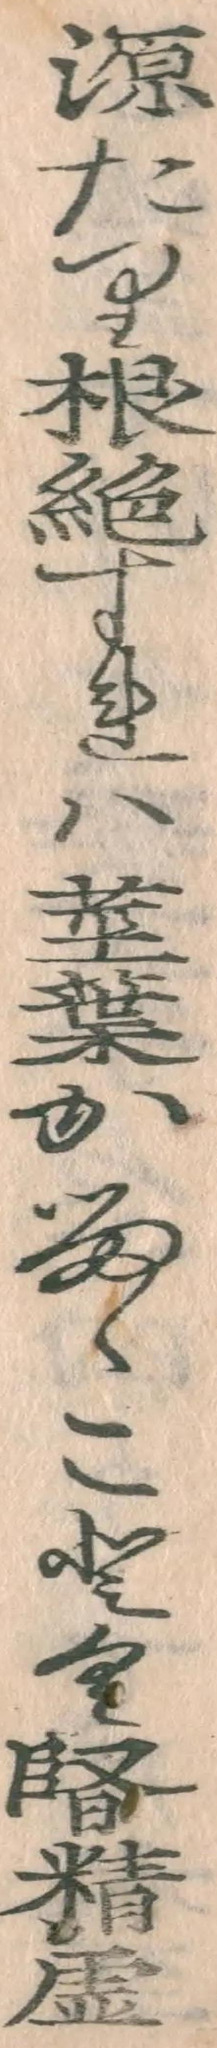源たり根絶すれは茎葉かふくことく腎精虚
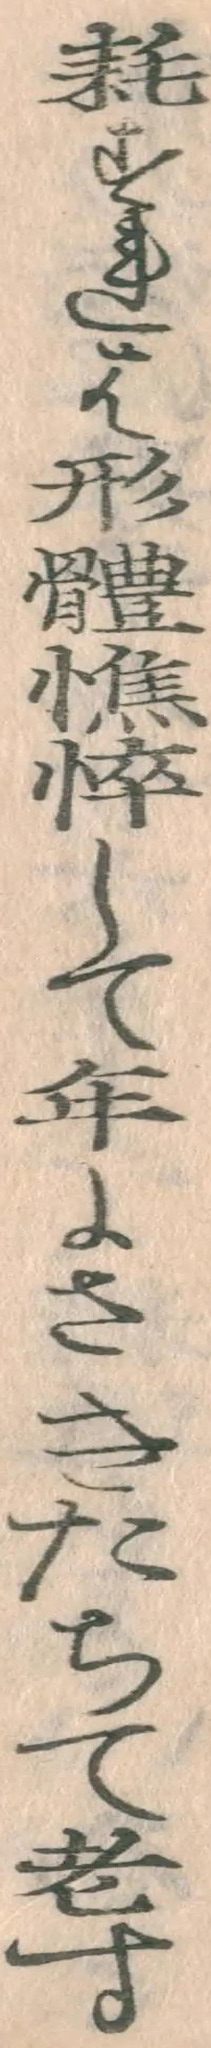耗すれは形体憔悴して年にさきたちて老す
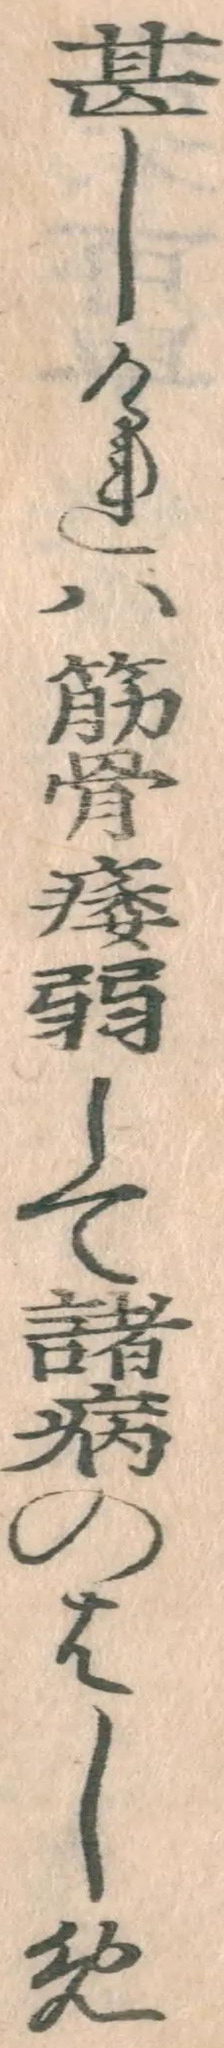甚しけれは筋骨痿弱して諸病のはしめ
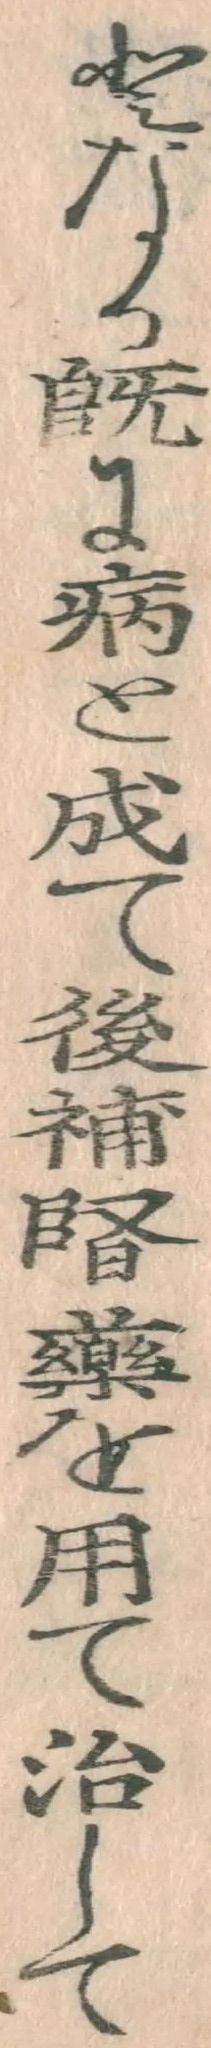となる既に病と成て後補腎薬を用て治して
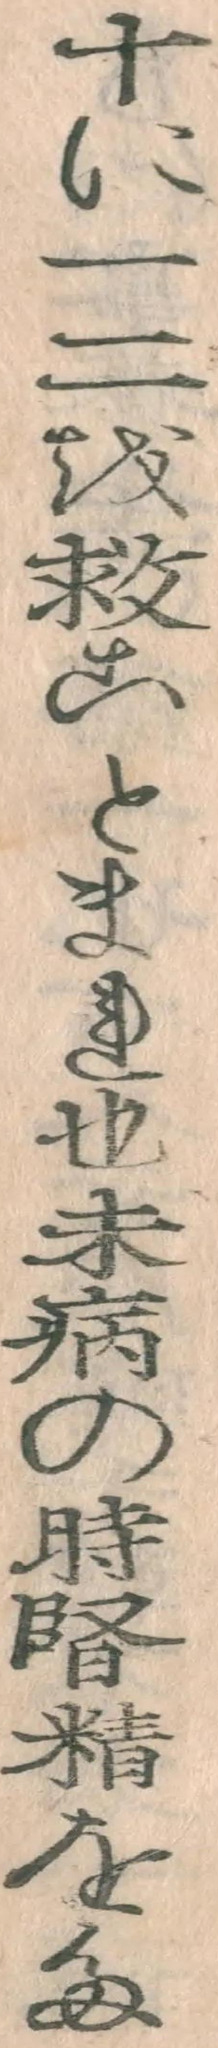十に一二を救ことまれ也未病の時腎精をた

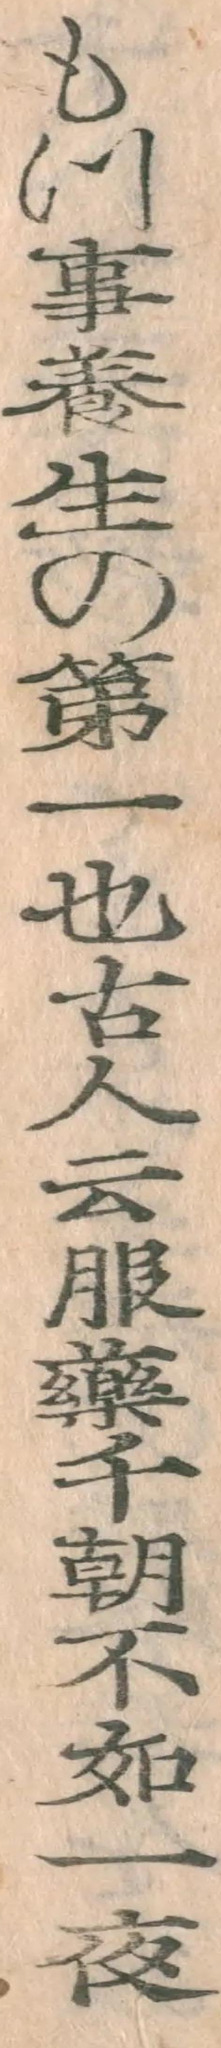もつ事養生の第一也古人云服薬千朝不如一夜
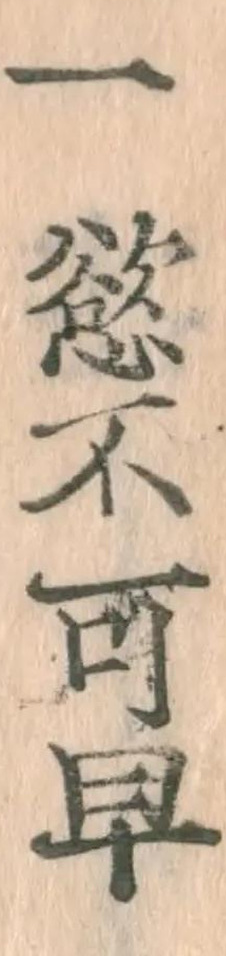一慾不可早
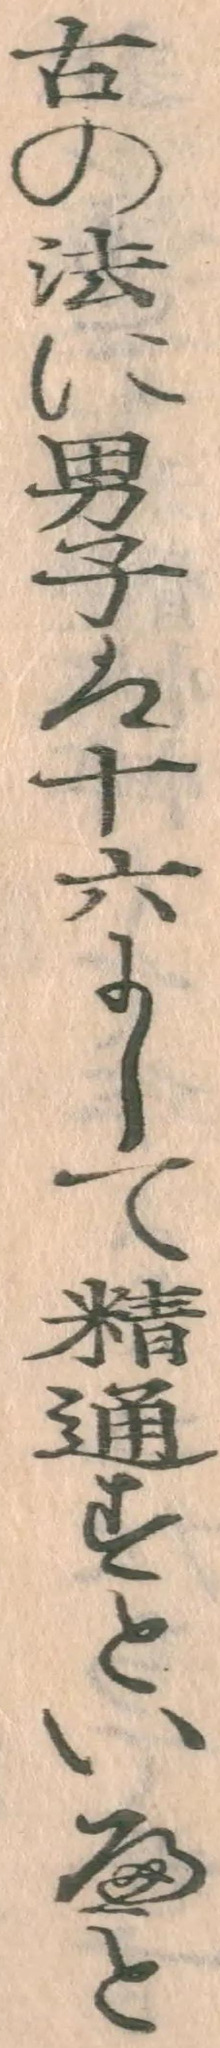古の法に男子は十六にして精通すといへと
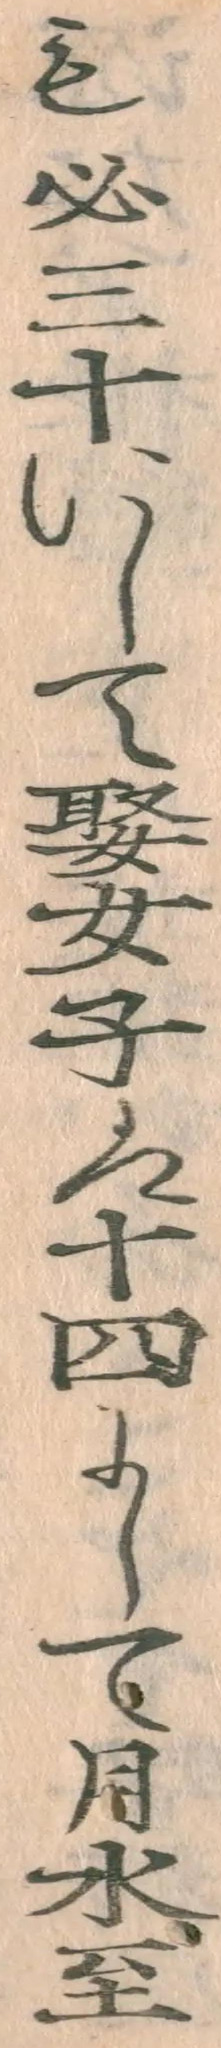も必三十にして娶女子は十四にして月水至
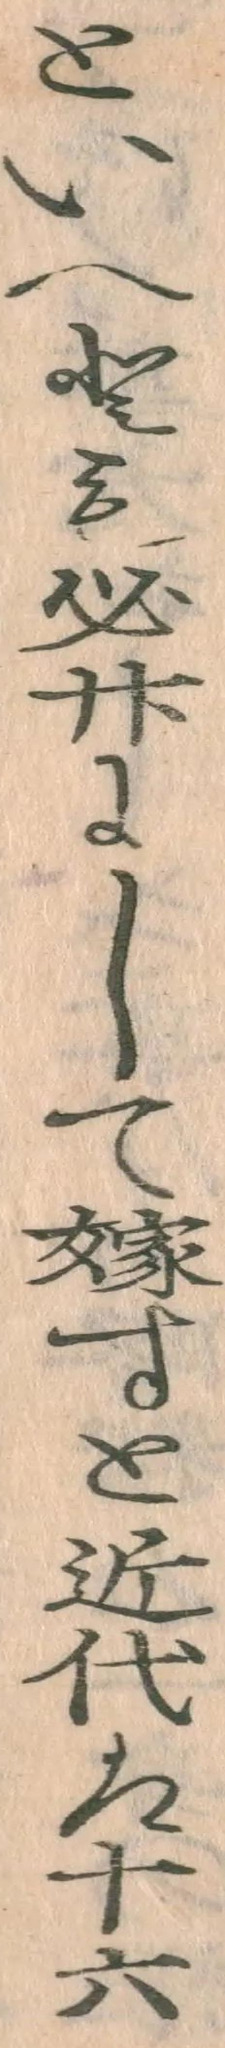といへとも必廿にして嫁すと近代は十六
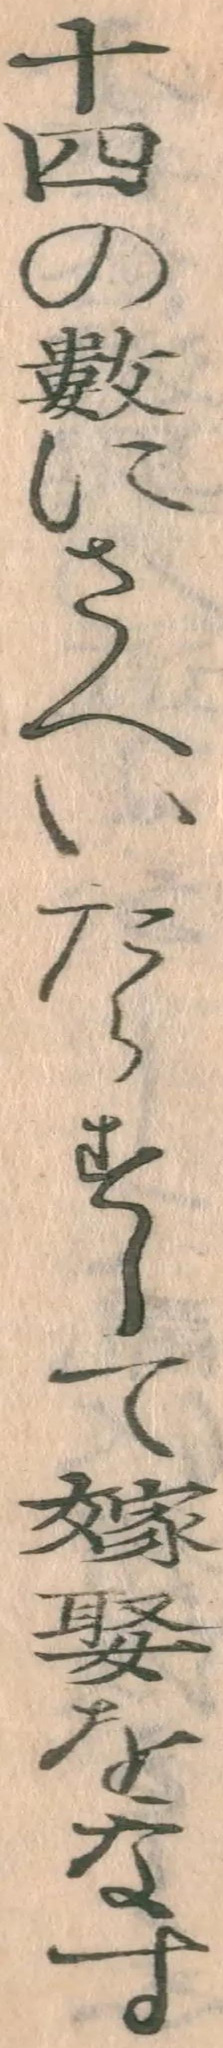十四の数にさへいたらすして嫁娶をなす
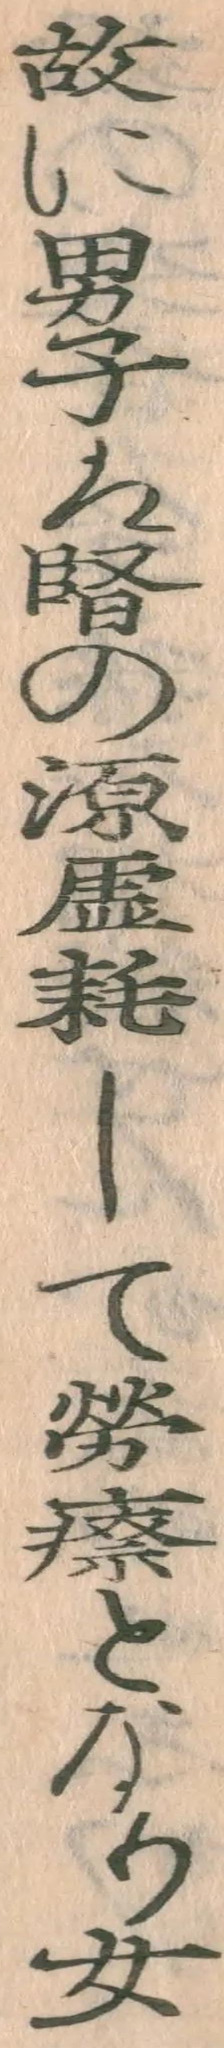故に男子は腎の源虚耗して労瘵となり女
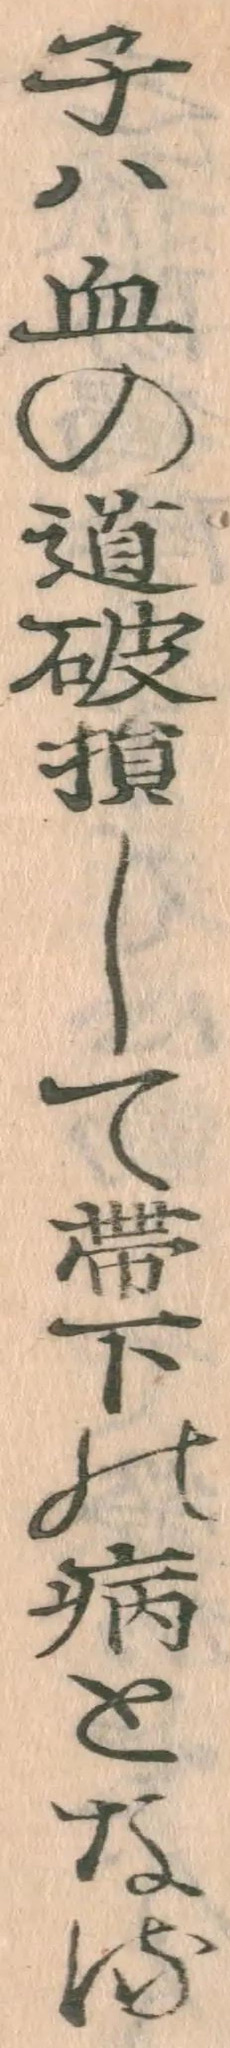子は血の道破損して帯下の病となる
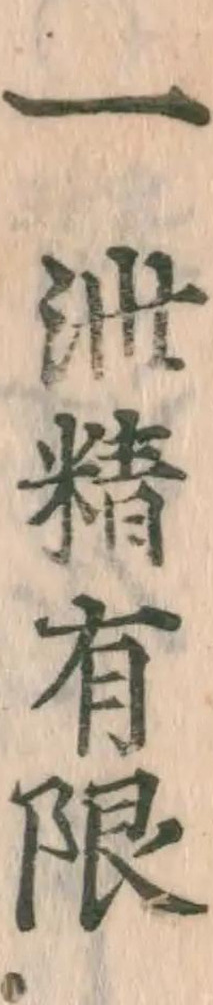一泄精有限
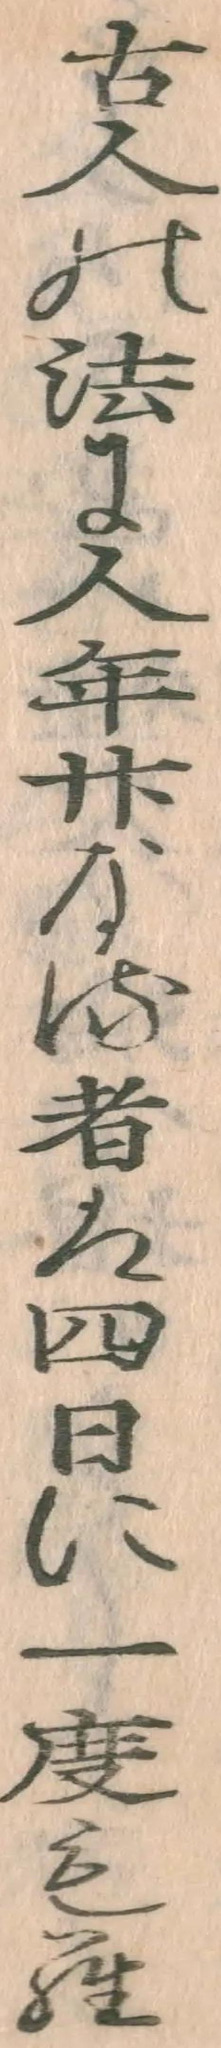古人の法に人年廿なる者は四日に一度もら
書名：延壽撮要
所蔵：国立国会図書館 National Diet Library, JAPAN
